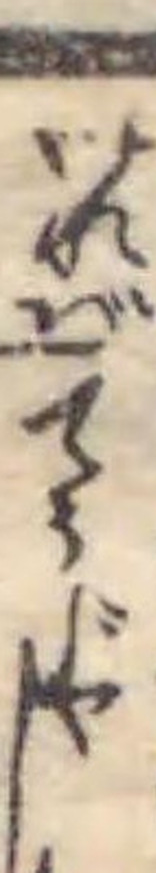ければてうじや
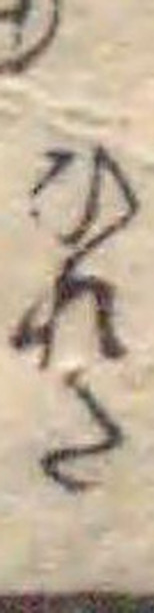ひれた
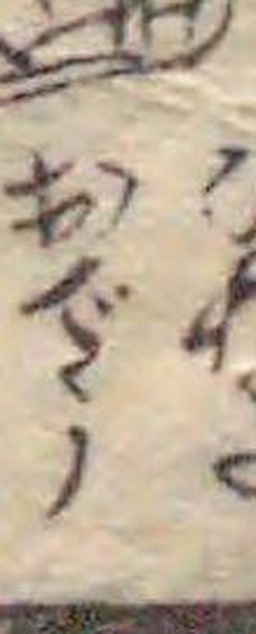おでう
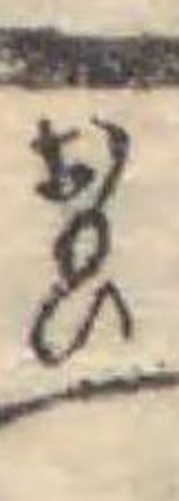おもひ
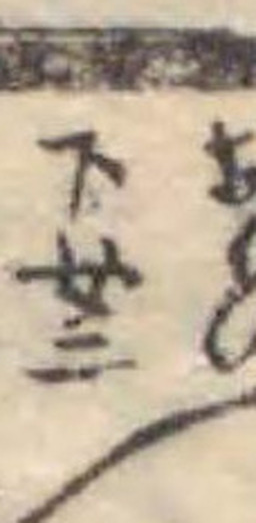下女二
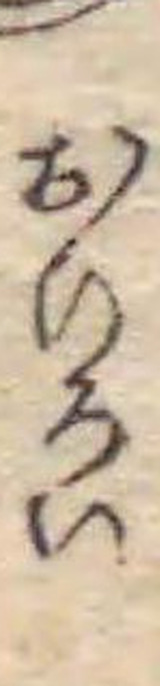おひろい
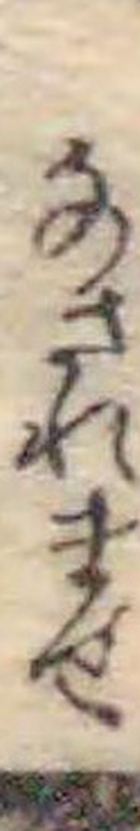なされませ
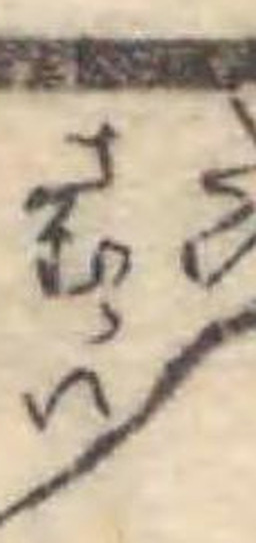さむらい
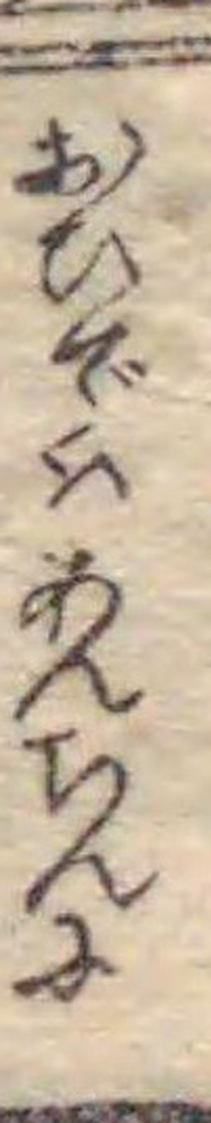おひではあんちんに
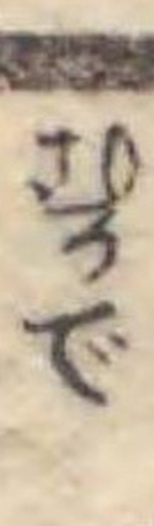むかで
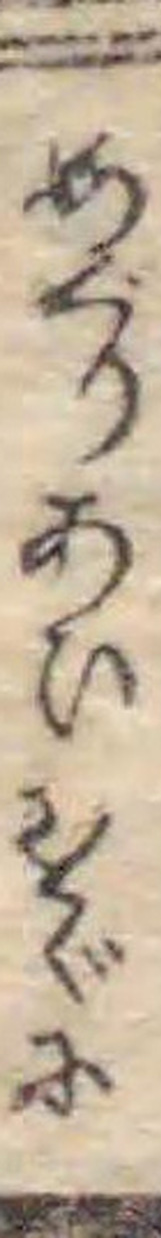めぐりあいすぐに
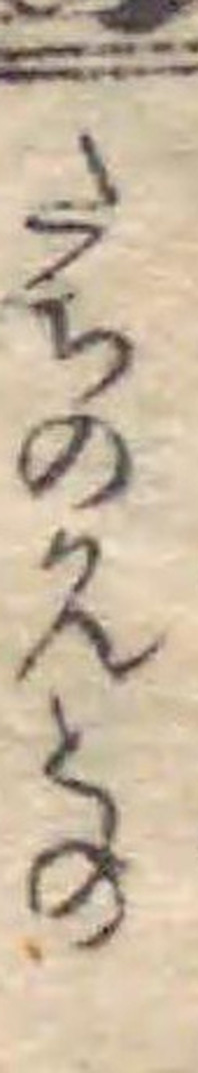たちのかんとの
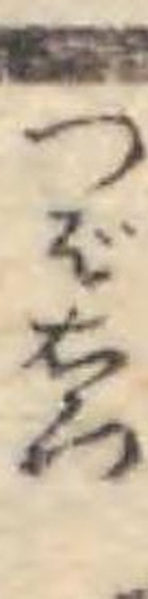つば右衛門
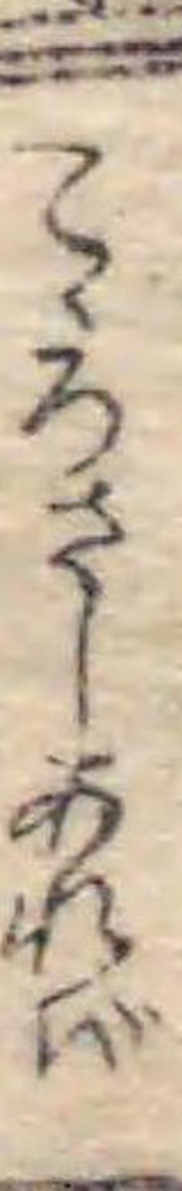こゝろさしあれば
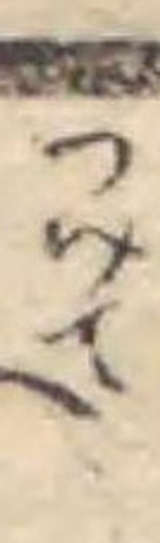つけて
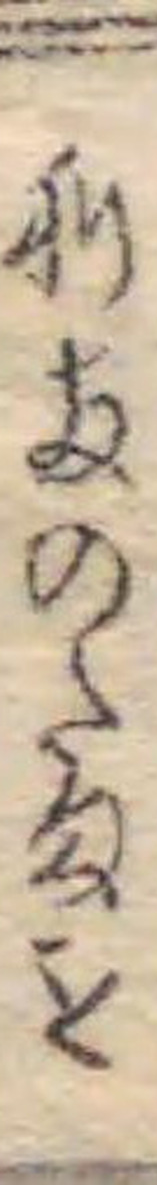利両のたまを
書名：鐘入七人化粧 : 3巻
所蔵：国立国会図書館 National Diet Library, JAPAN
